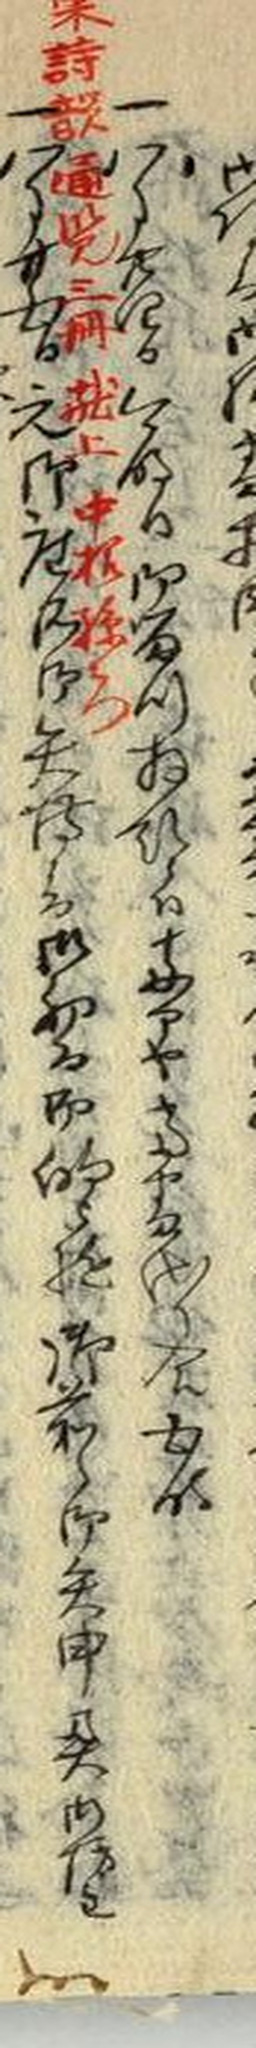一八月廿五日元御座所御矢場ニ而御初而御的被遊御前之御矢申奥御坊主
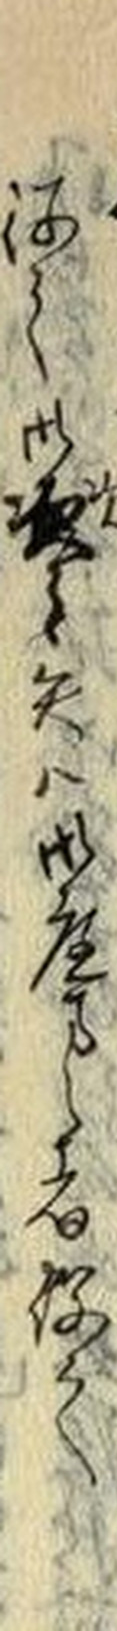役之御次之矢ハ御庭方之者役之
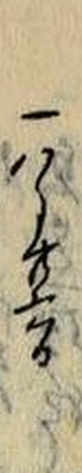一八月廿六日
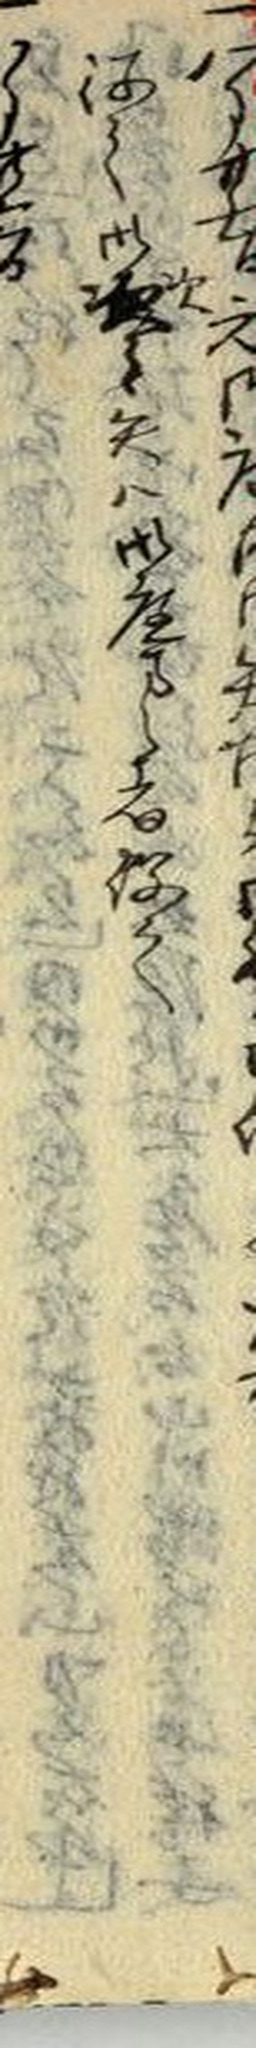廿二日
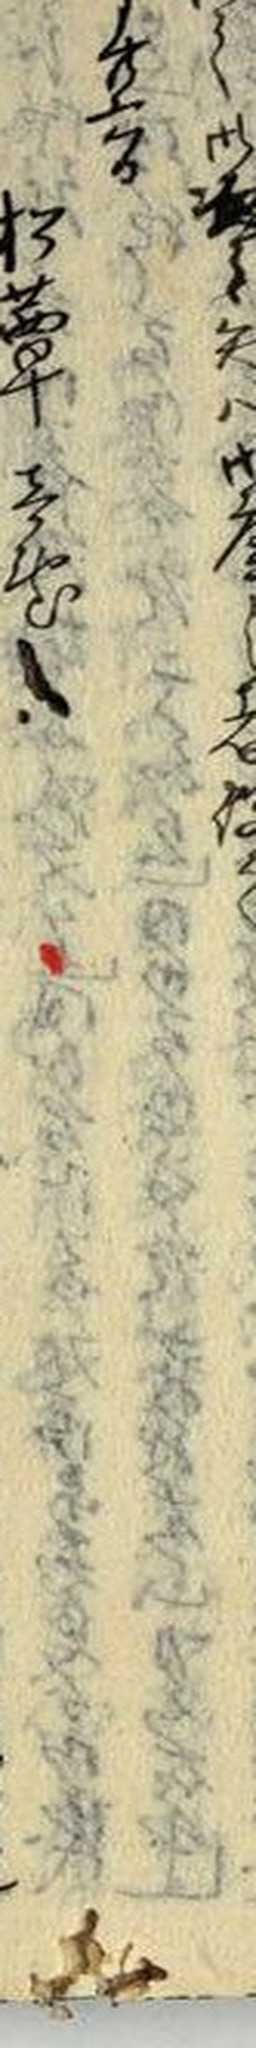松蕈壱台
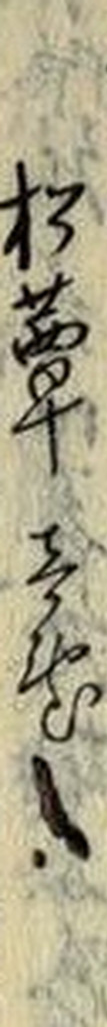松蕈壱台
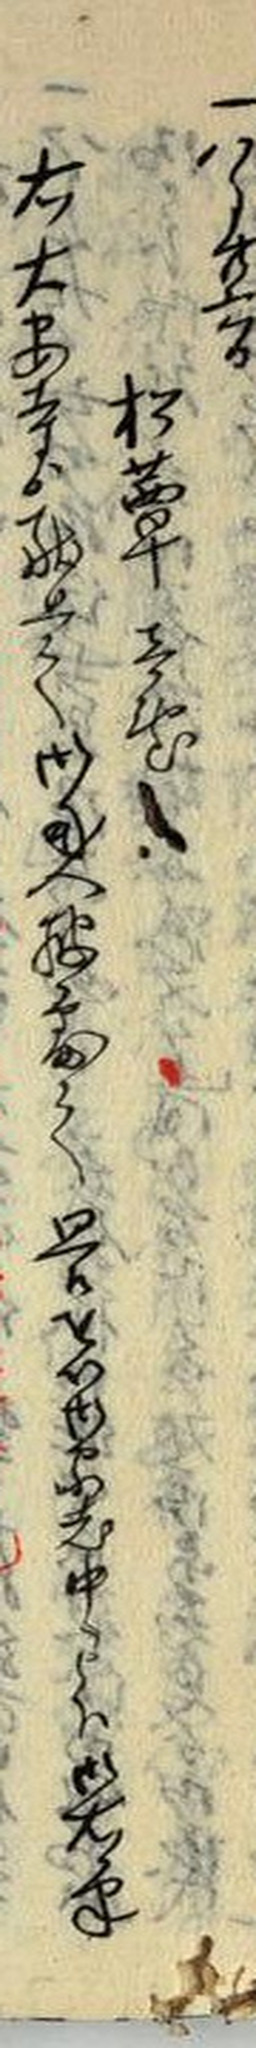右大安寺ゟ献上之御用人披露之思召を以御家老中へ被下御右筆
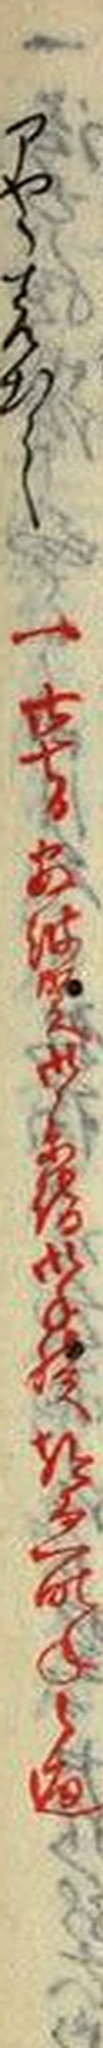部やへ差出之一廿七日安波賀御参詣御手続都而一昨年之通
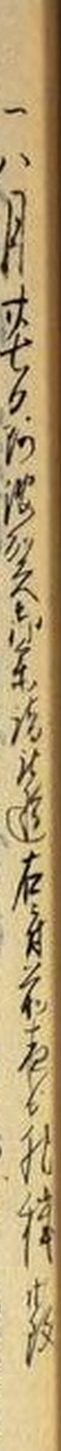一八月廿七日阿波賀御参詣被遊右ニ付前夜ゟ服穢御改
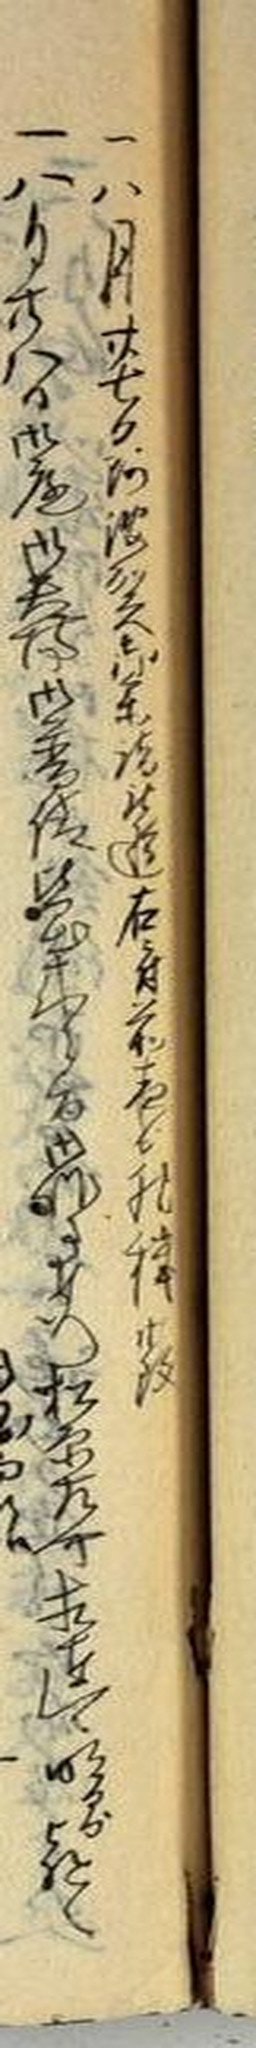一八月廿八日御庭御矢場御普請皆出来候旨御作事奉行松原左介相達候明日ゟ被遊候
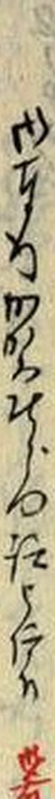御奉行加賀次郎右衛門跡被仰付
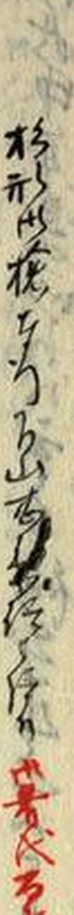杉形御槍奉行下山甚兵衛跡被仰付
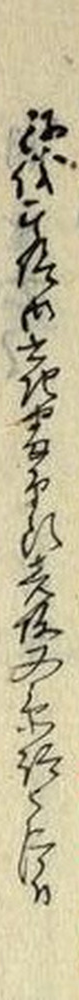役儀其儘御書院番筆頭彦坂又兵衛跡被仰付

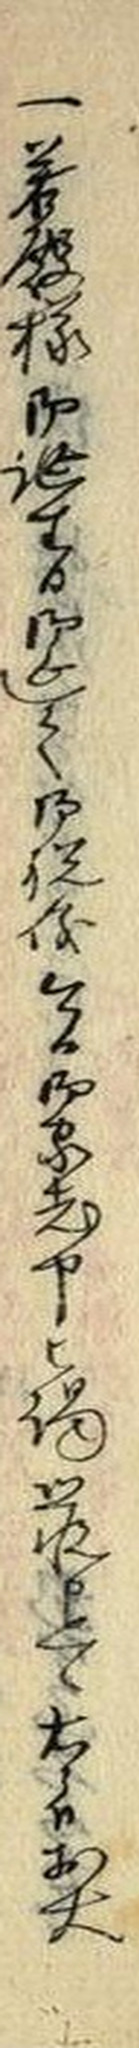一若殿様御誕生日御延之御祝儀今日御家老中被謁恐悦申上候右ニ付於大
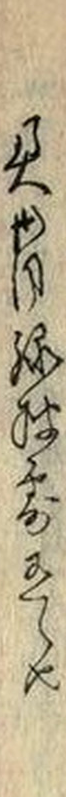奥御目録披露有之由
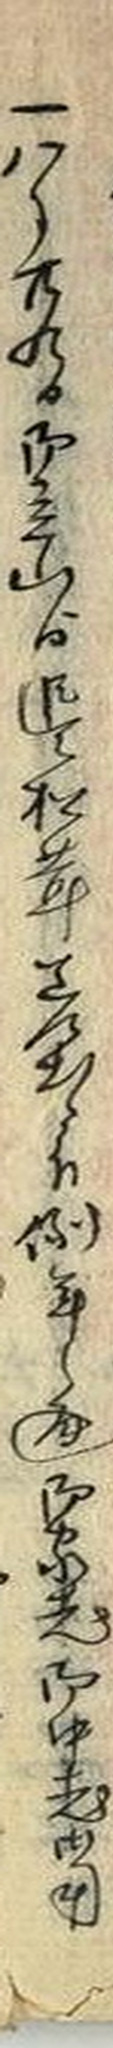一八月廿九日御立山ゟ追々松茸差出候ニ付例年之通御家老御中老御用
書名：少傅日録抄（斉承付側向頭取日記、在国）
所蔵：福井県文書館 Fukui Prefectural Archives
